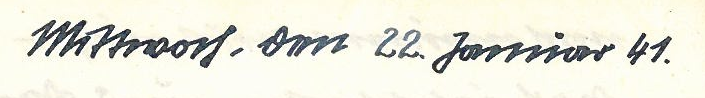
Mittwoch, den 22. Januar 41.
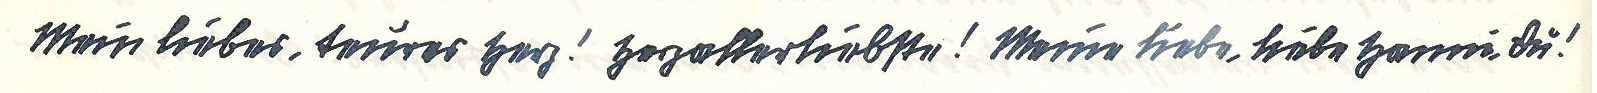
Mein liebes, teures Herz! Herzallerliebste! Meine liebe, liebe, Du!
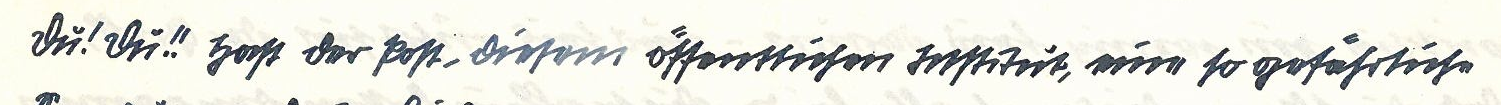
Du! Du!! Hast der Post, diesem öffentlichen Institut, eine so gefährliche
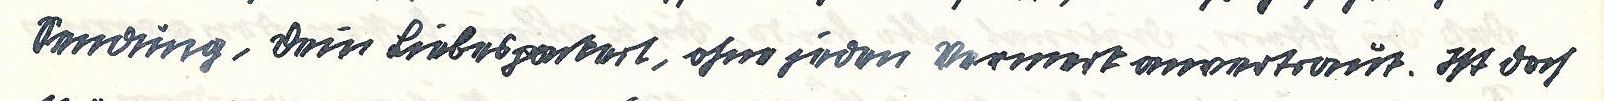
Sendung, Dein Liebespaket, ohne jeden Vermerk anvertraut. Ist doch
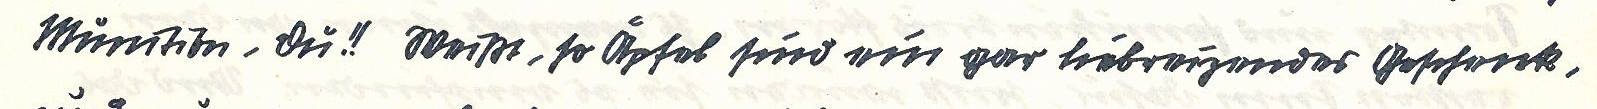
Munition, Du!! Weißt, so Äpfel sind ein gar liebreizendes Geschenk,
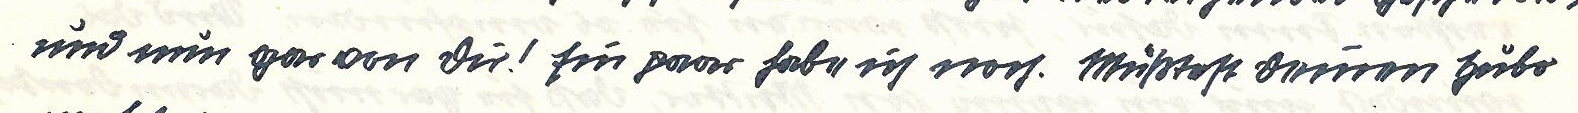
und nun gar von Dir! Ein paar habe ich noch. Müßtest Deinen Hubo
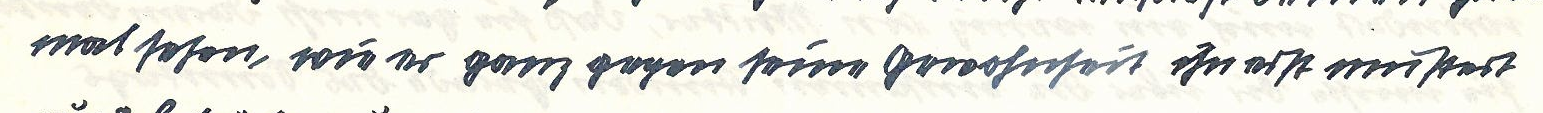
mal sehen, wie er ganz gegen seine Gewohnheit ihn erst mustert
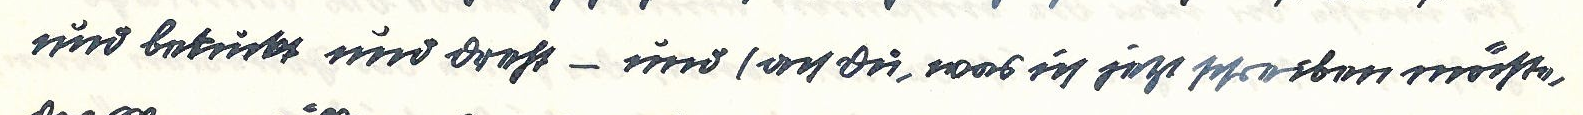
und bekuckt und dreht – und (ach Du, was ich jetzt schreiben möchte,
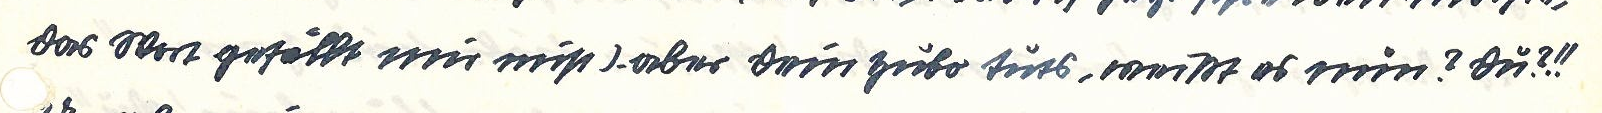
das Wort gefällt mir nicht) – aber Dein Hubo tuts, weißt es nun? Du?!!
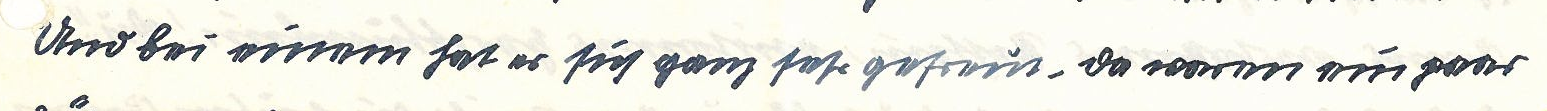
Und bei einem hat er sich ganz sehr gefreut, da waren ein paar
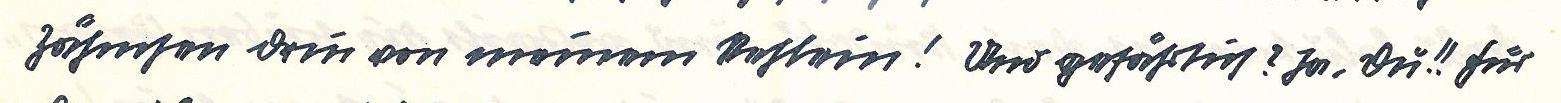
Zähnchen drin von meinem Rehlein! Und gefährlich? Ja, Du!! Für
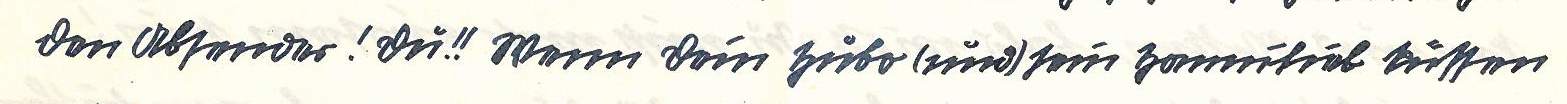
den Absender!! Du!! Wenn Dein Hubo (und) sein lieb küssen
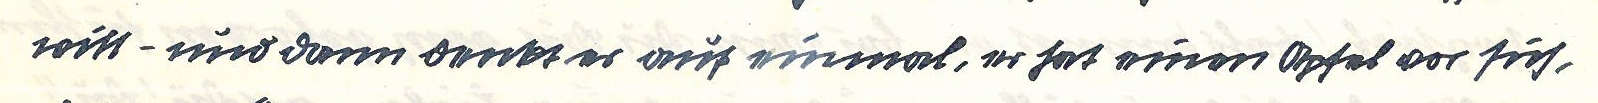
will – und dann denkt er auf einmal, er hat einen Apfel vor sich,
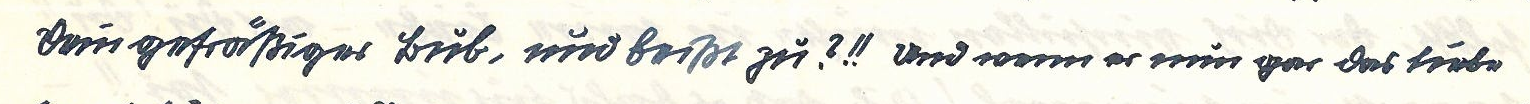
Dein gefräßiger Bub, und beißt zu?!! Und wenn er nun gar das liebe
